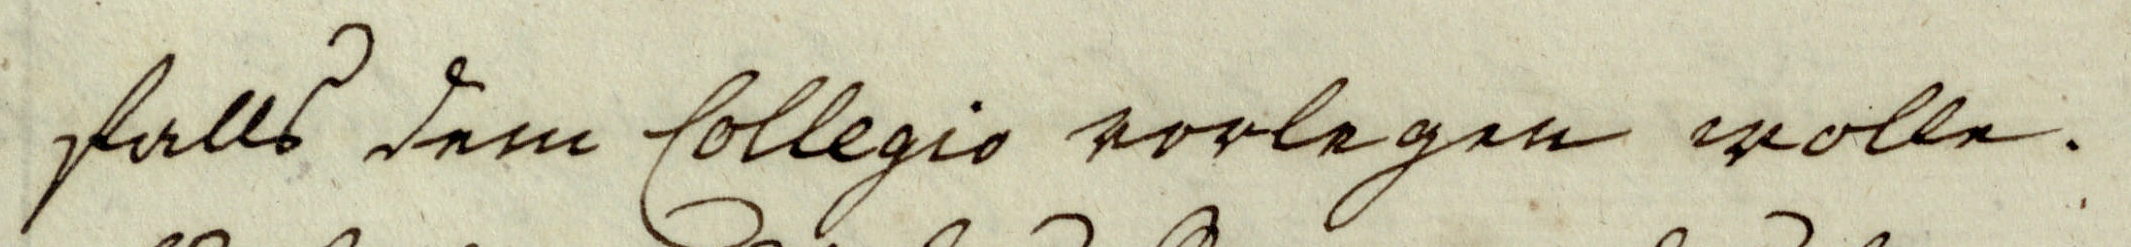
falls dem Collegio vorlegen wolle.
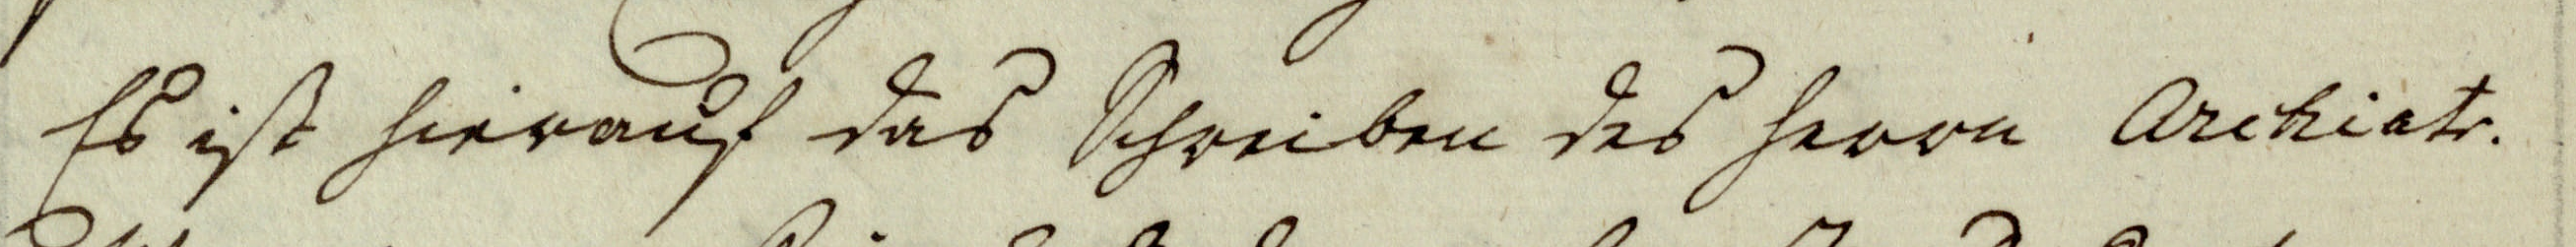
Es ist hierauf das Schreiben des Herrn Archiat.
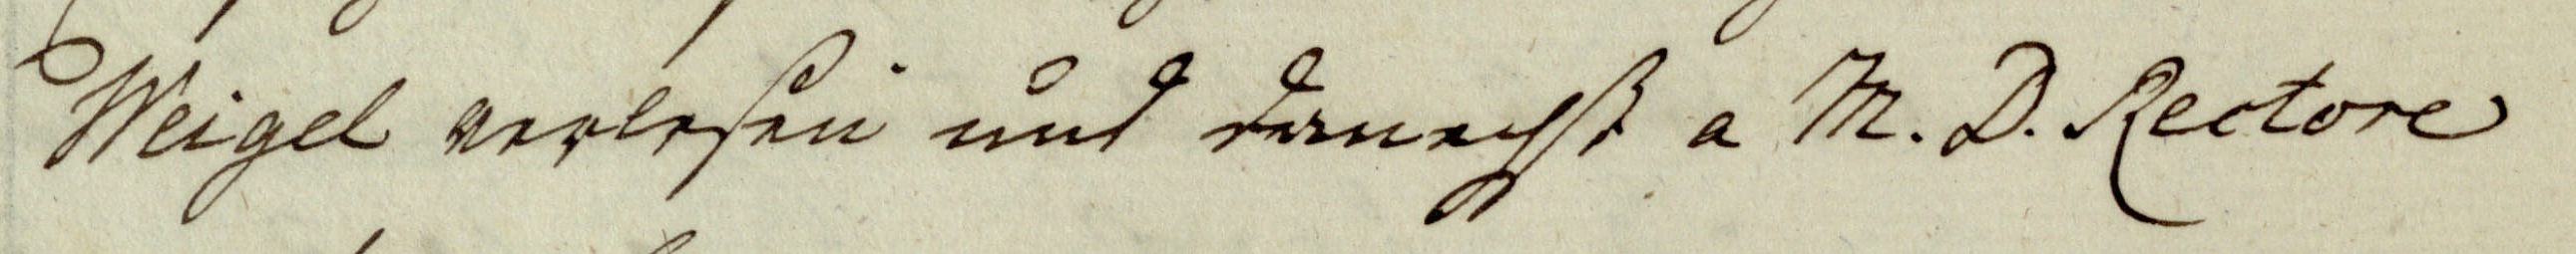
Weigel verlesen und danechst a M. D. Rectore
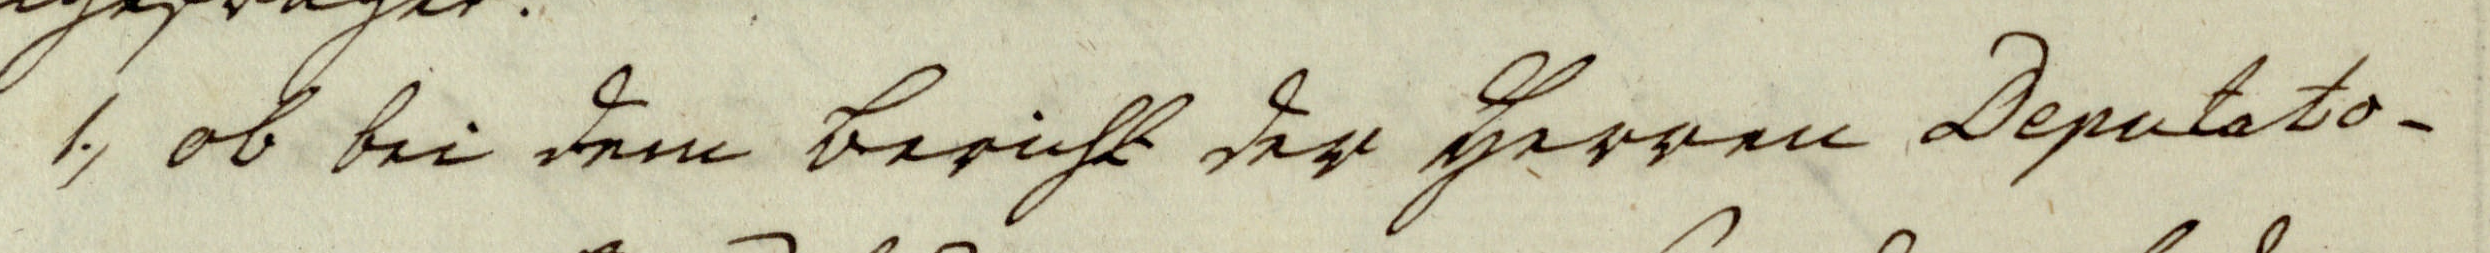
1., ob bei dem Bericht der Herren Deputato-
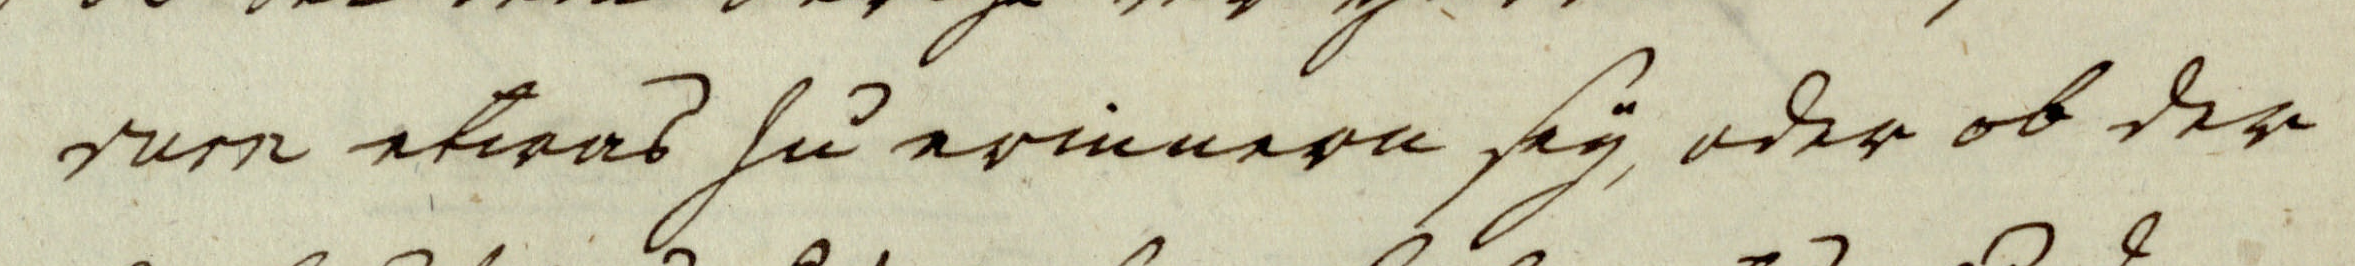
um etwas zu erinnern seÿ, oder ob der
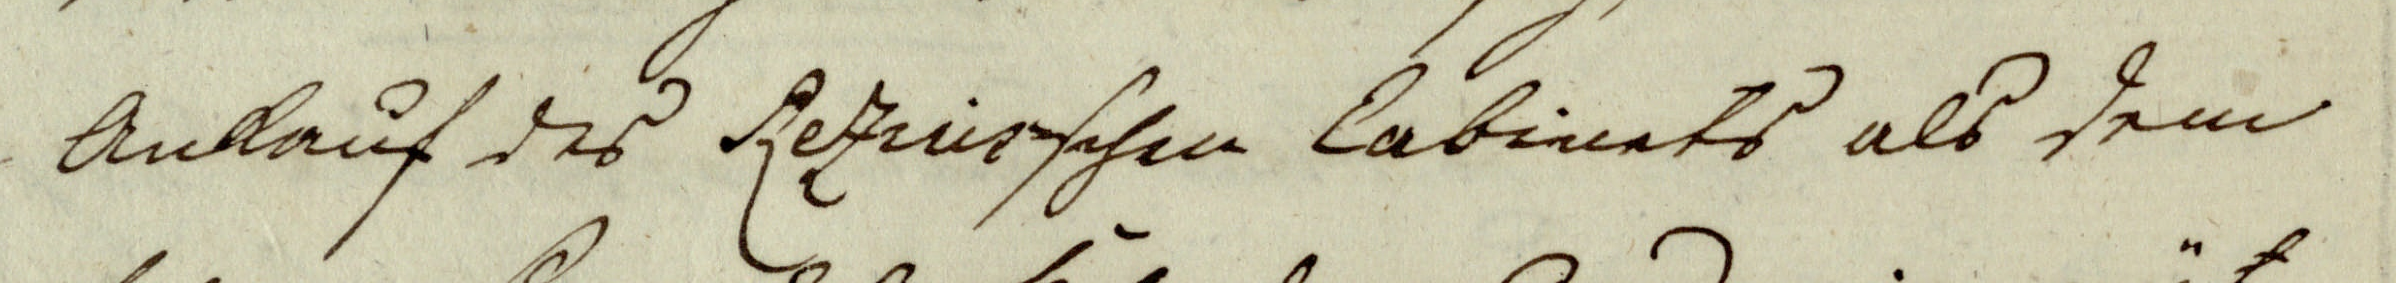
Ankauf des Reziusschen Cabinets als dem
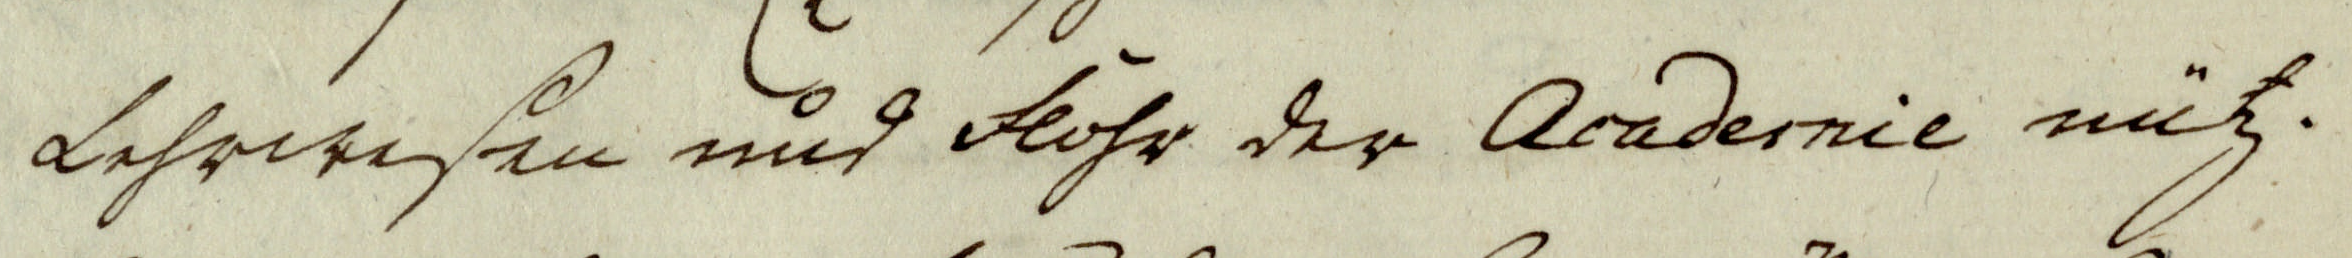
Lehrwesen und Flohr der Academie nütz¬
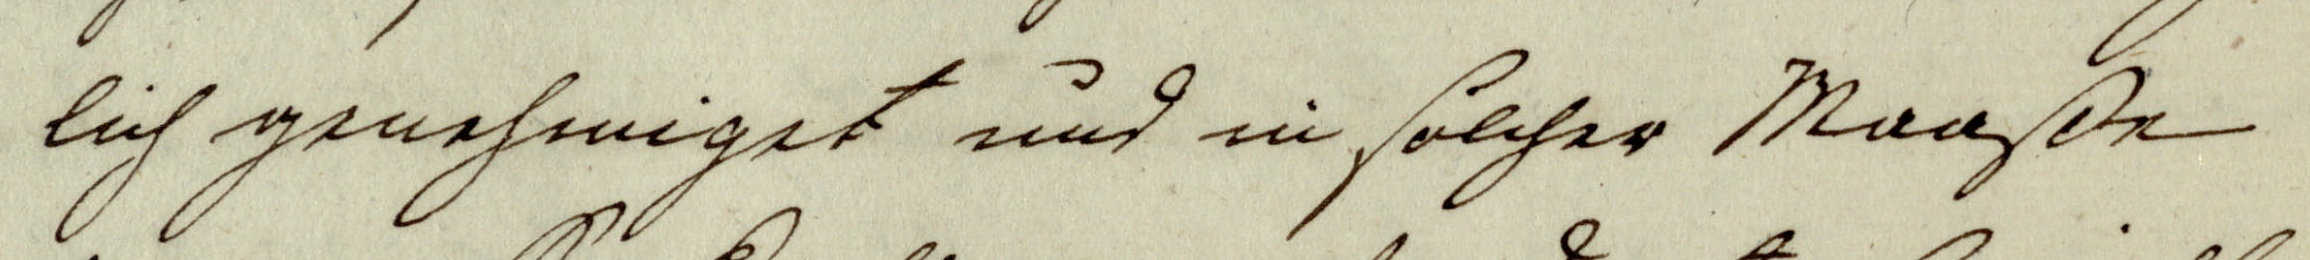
lich genehmiget und in solcher Maaße
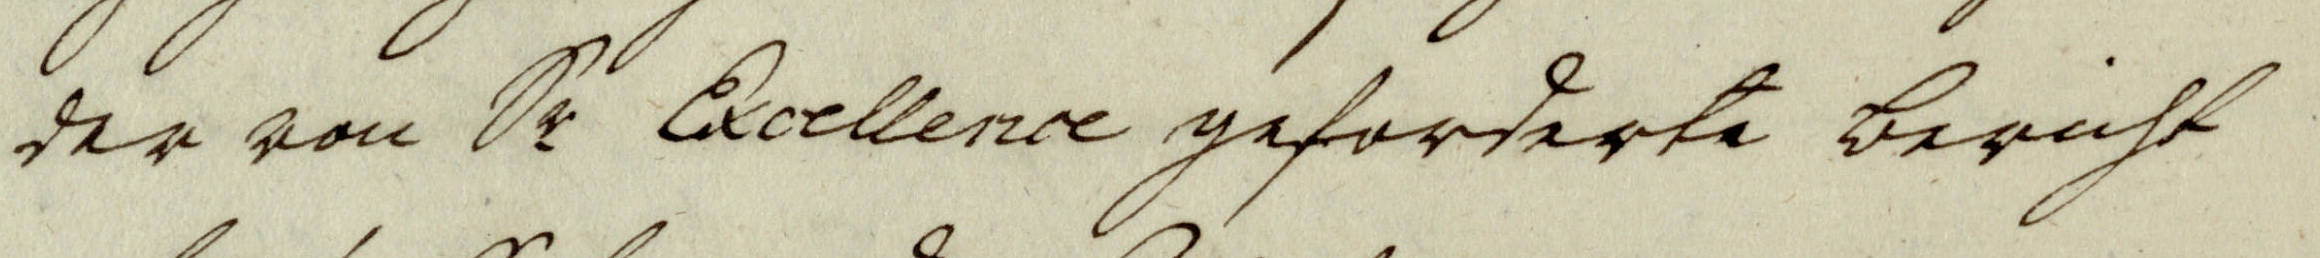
der von Sr Excellence geforderte Bericht
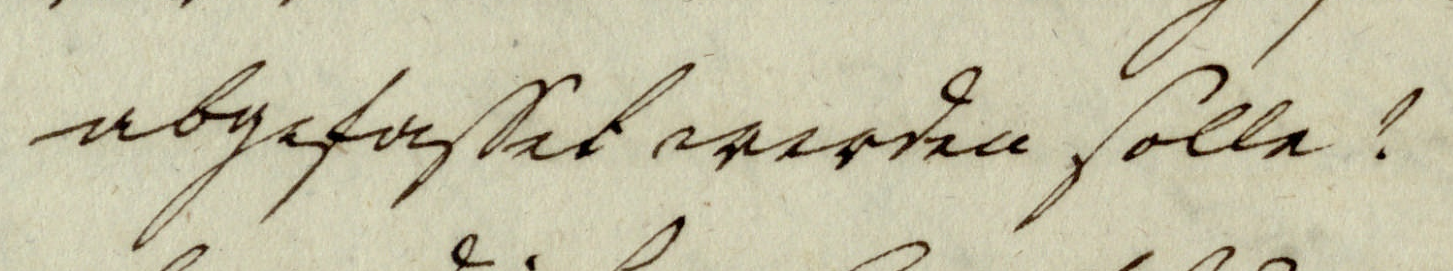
abgefasset werden solle?
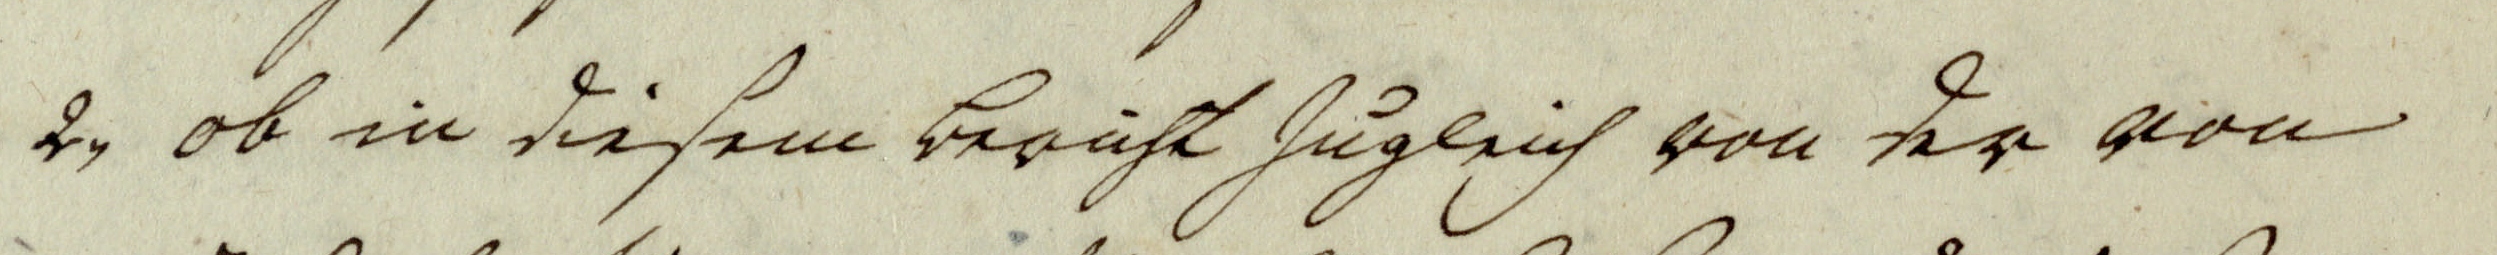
2., ob in diesem Bericht zugleich von der von
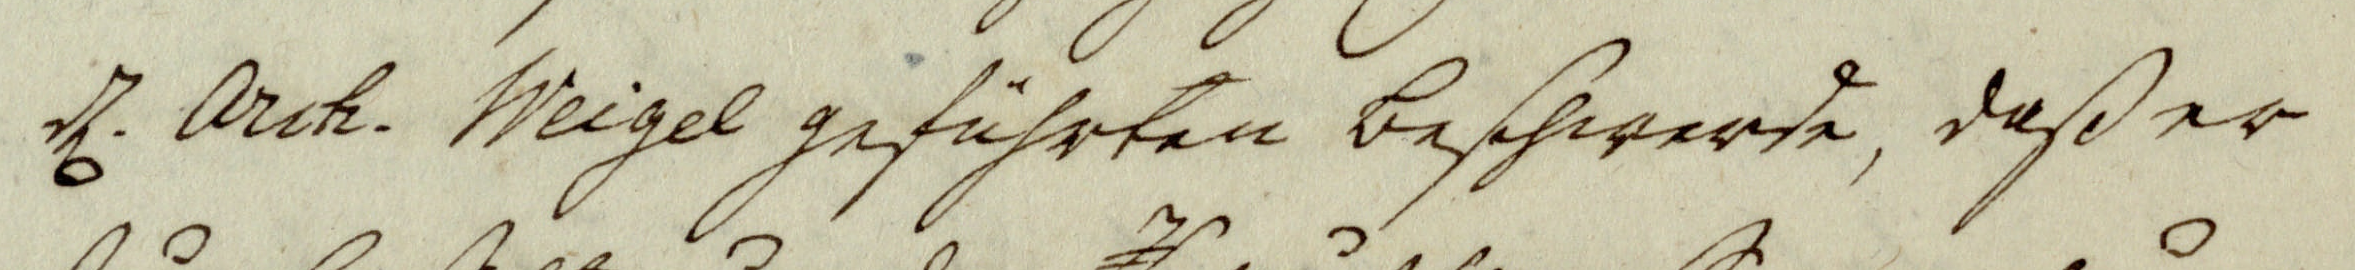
dh. Arch. Weigel geführten Beschwerde, daß er
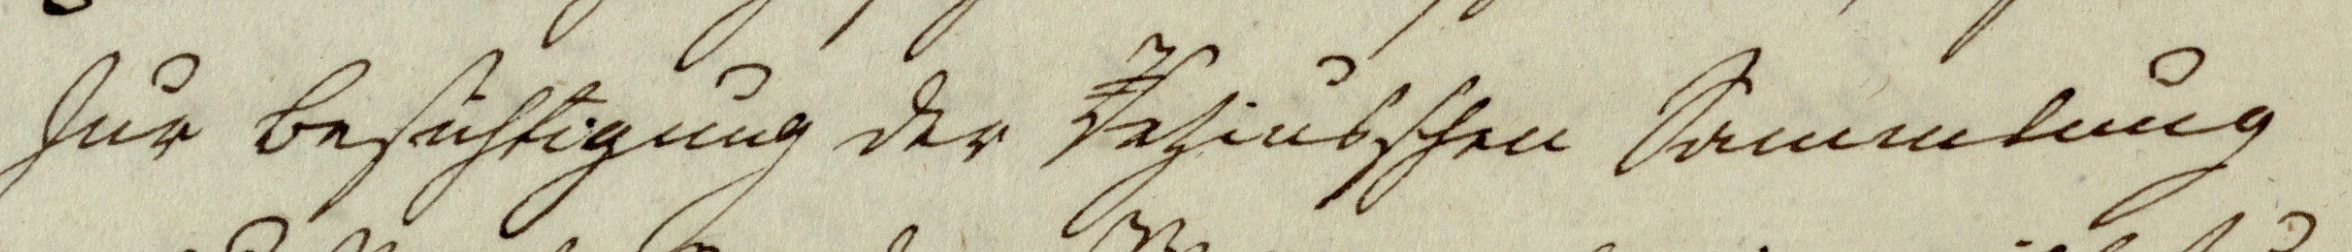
zur Besichtigung der Reziusschen Sammlung
